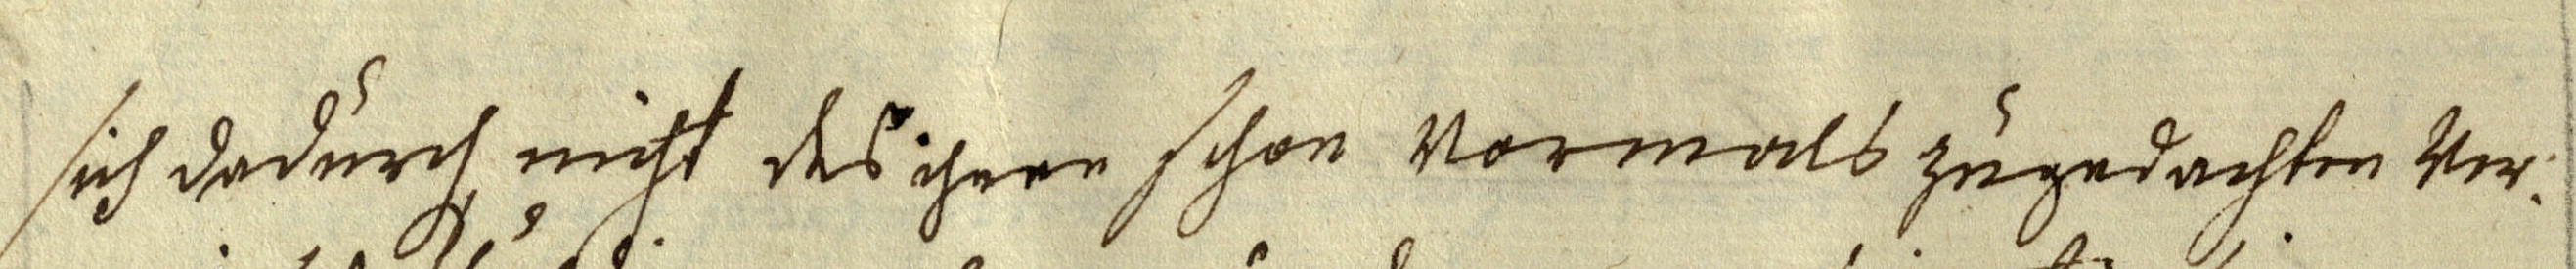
sich dadurch nicht des ihnen schon vormals zugedachten Ver¬
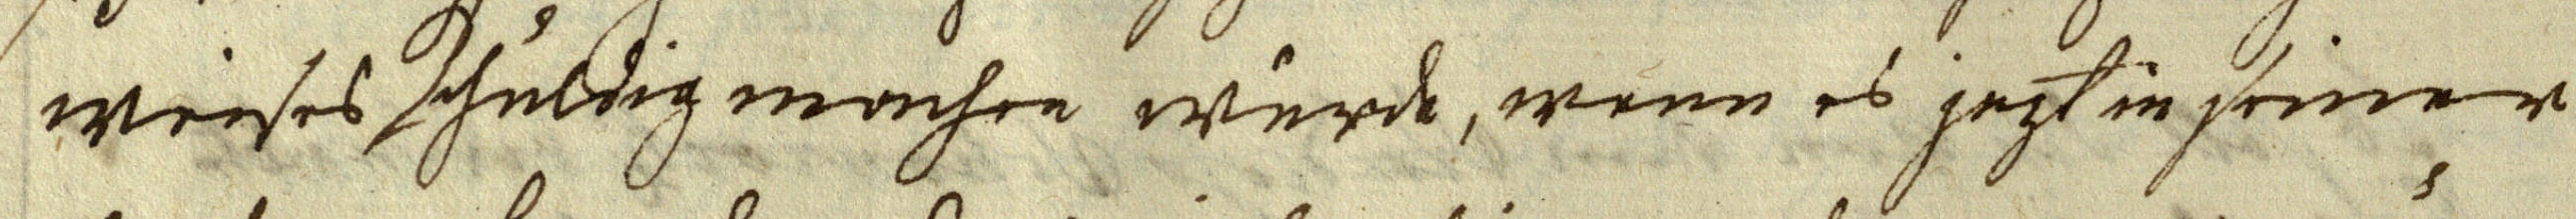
weises schuldig machen würde, wenn es jezt in seiner
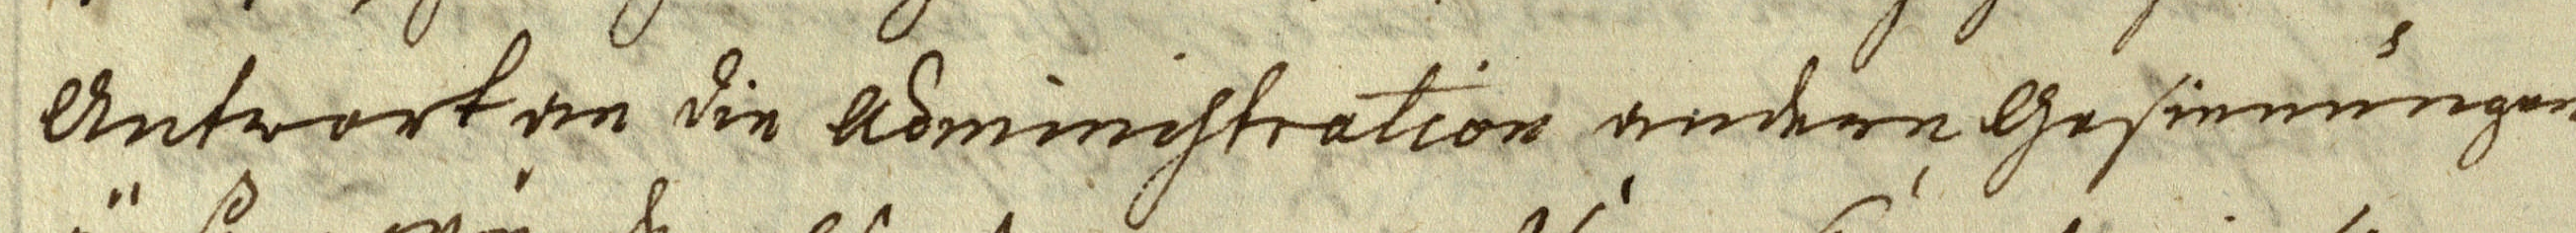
Antwort an die Administration andere Gesinnungen
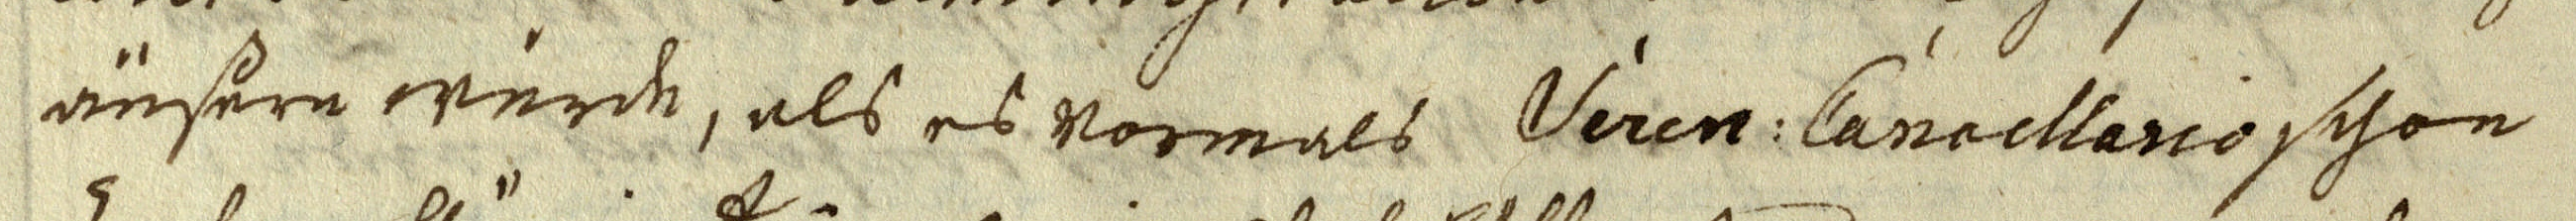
äußern würde, als es vormals Seren. Cancellario schon
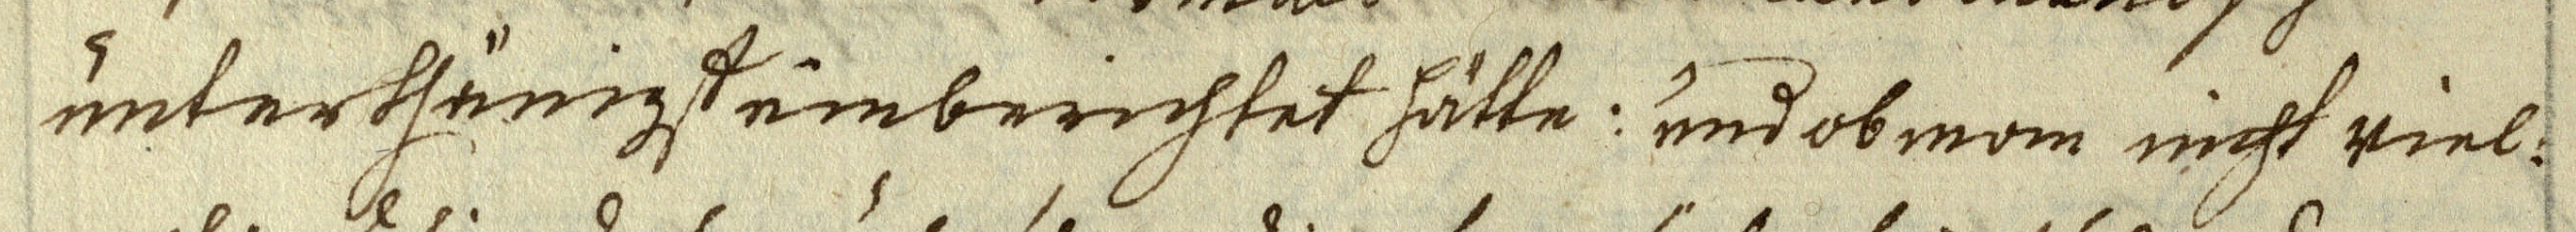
unterthänigst einberichtet hätte: und ob man nicht viel¬
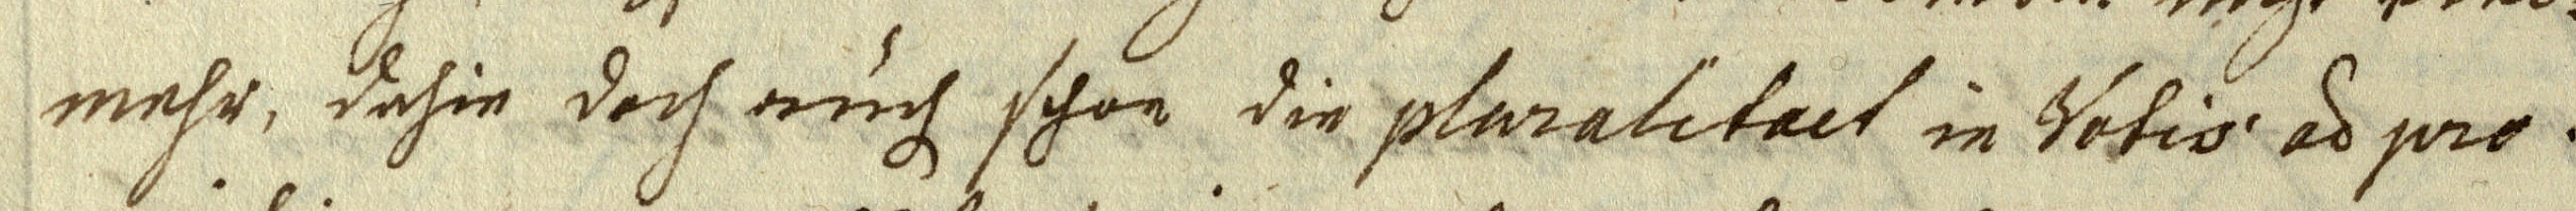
mehr, dahin doch auch schon die pluralitaet in Votis ad pro¬
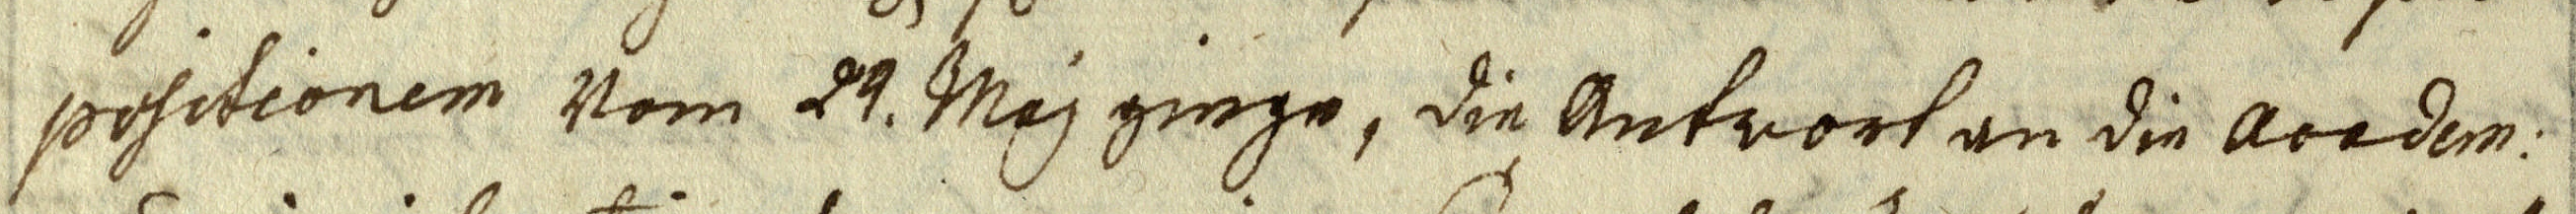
positionem vom 24. Maj ginge, die Antwort an die Academ:
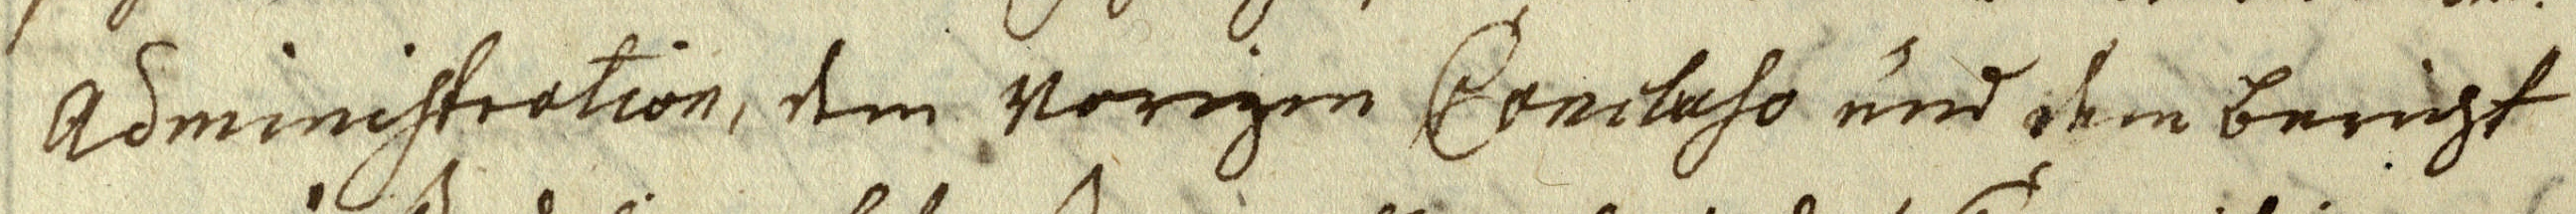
Administration, dem vorigen Concluso und dem Bericht
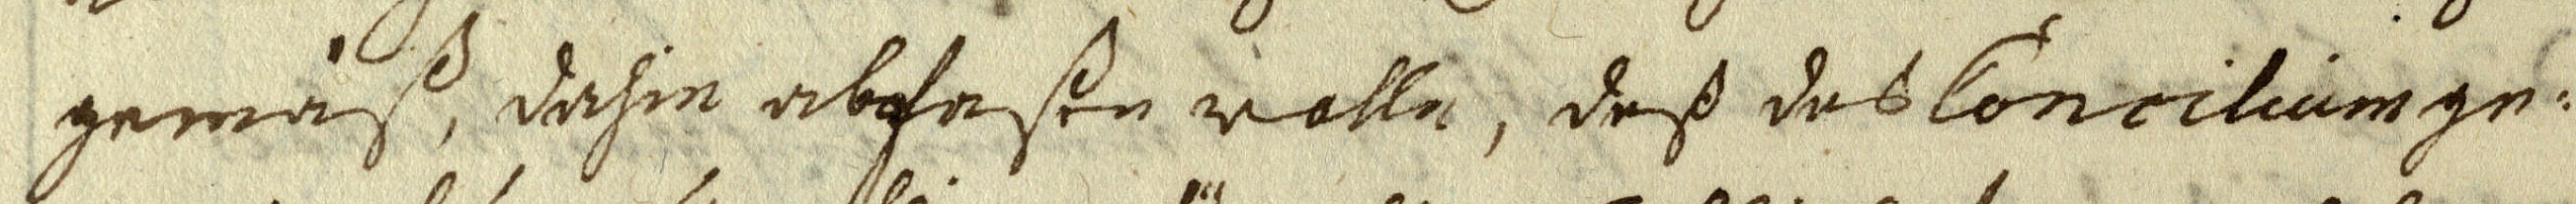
gemäß, dahin abfaßen wolle, daß das Concilium ge¬
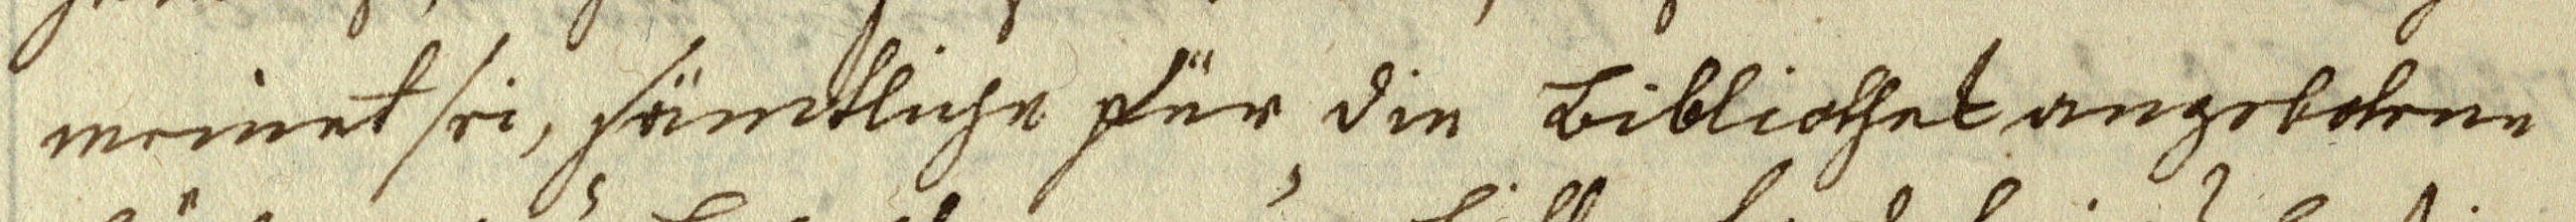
meinet sei, sämliche für die Bibliothek angebotene
